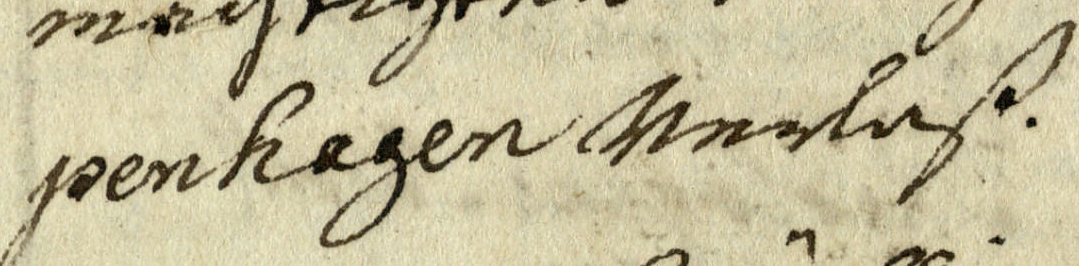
penhagen verlaß.
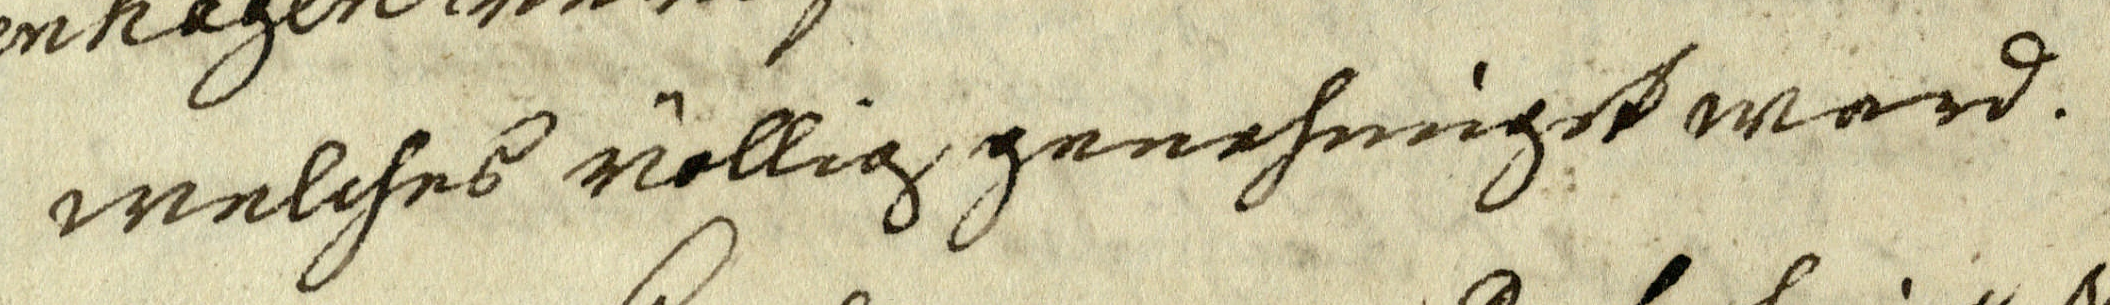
Welches völlig genehmiget ward.
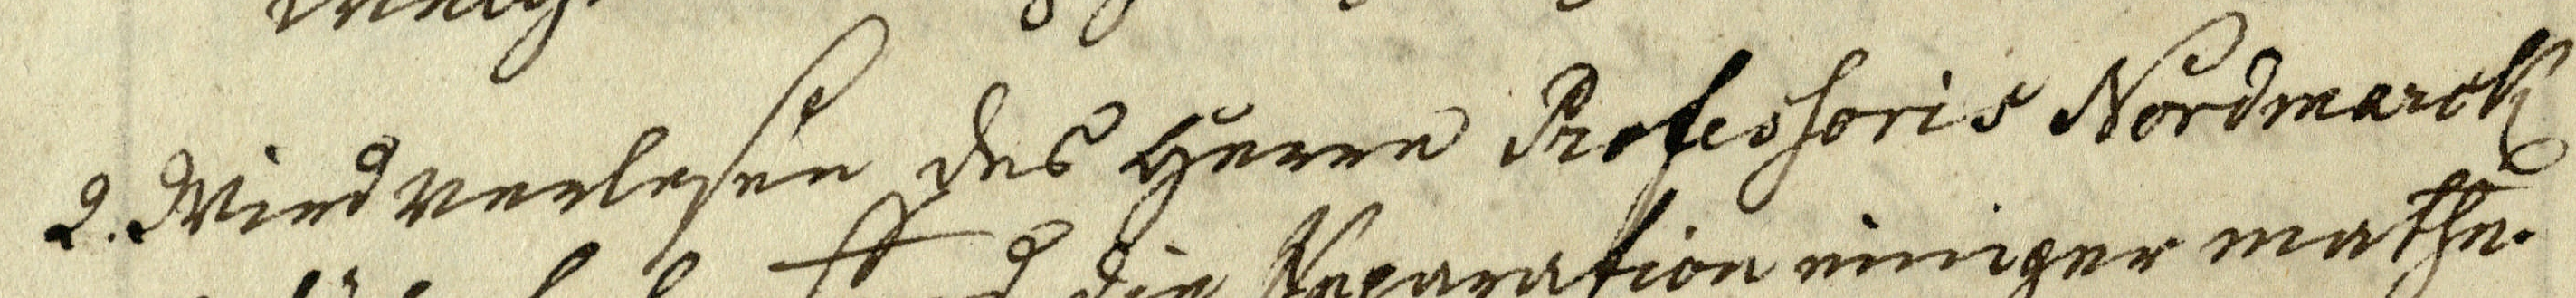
2. Wird verlesen des Herrn Professoris Nordmarck
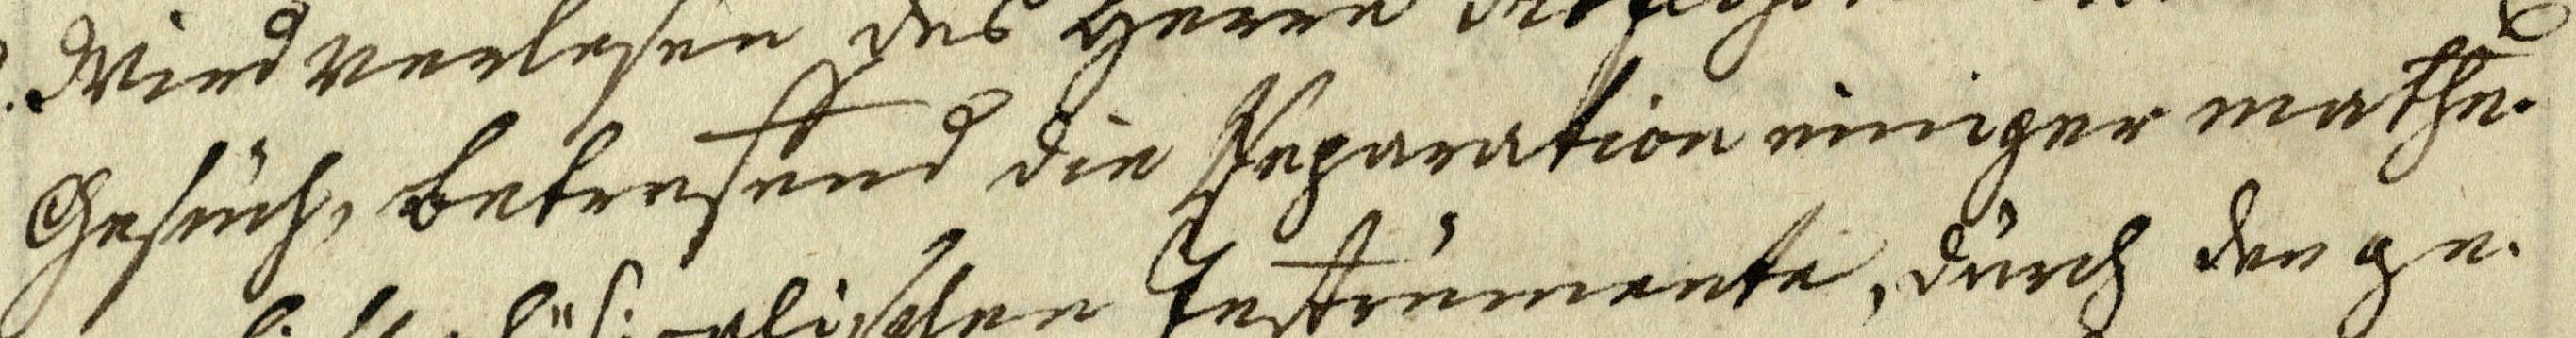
Gesuch, betreffend die Reparation einiger mathe¬
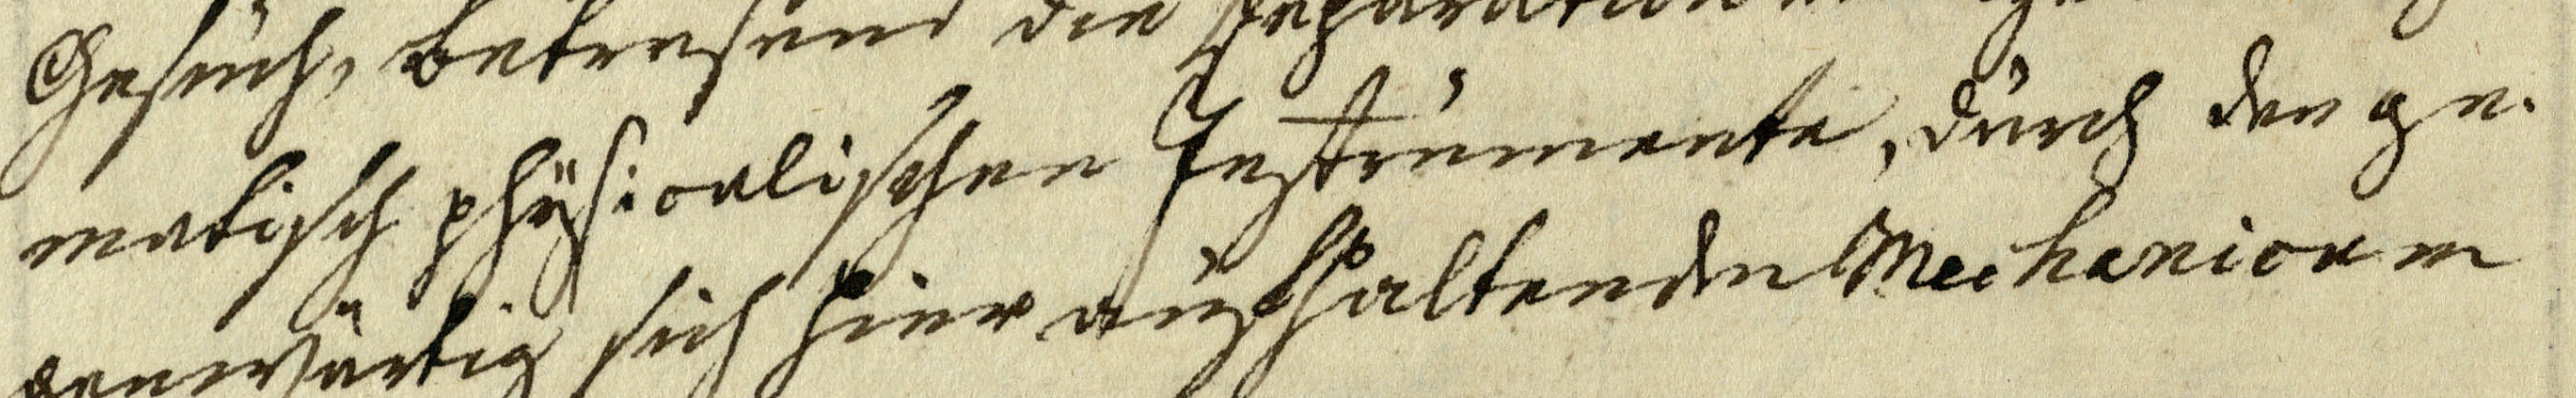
matisch physicalischen Instrumente, durch den ge¬
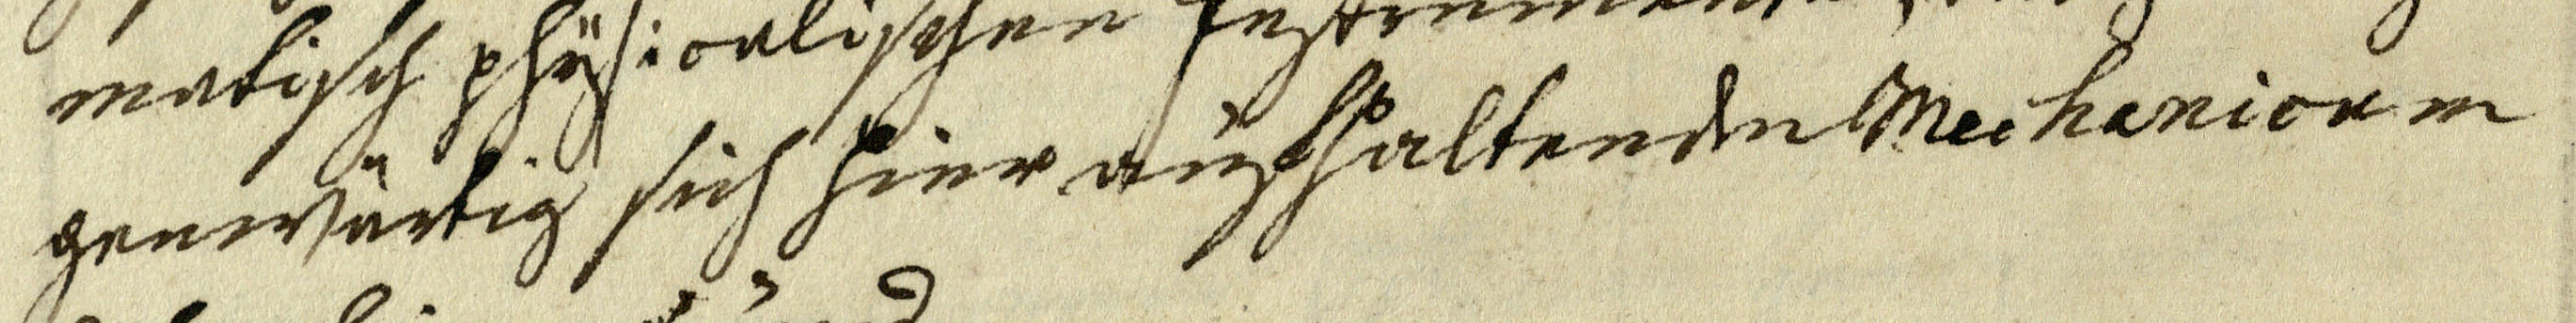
genwärtig sich hier aufhaltenden Mechanicum
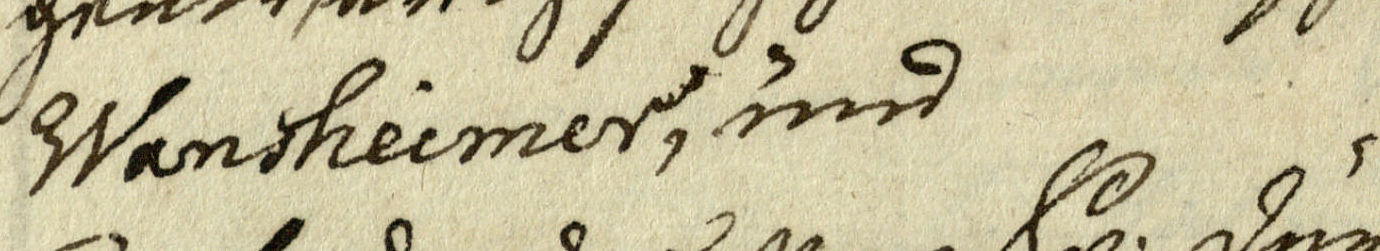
Wansheimer, und
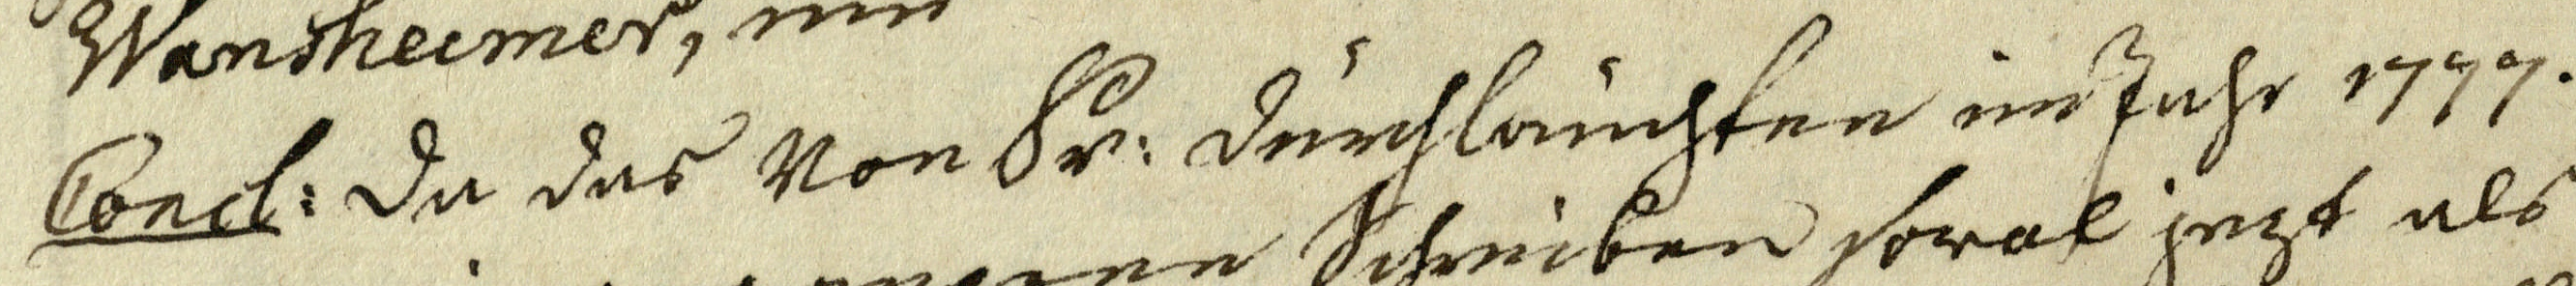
Concl. Da das von Sr. Durchlauchten im Jahr 1777
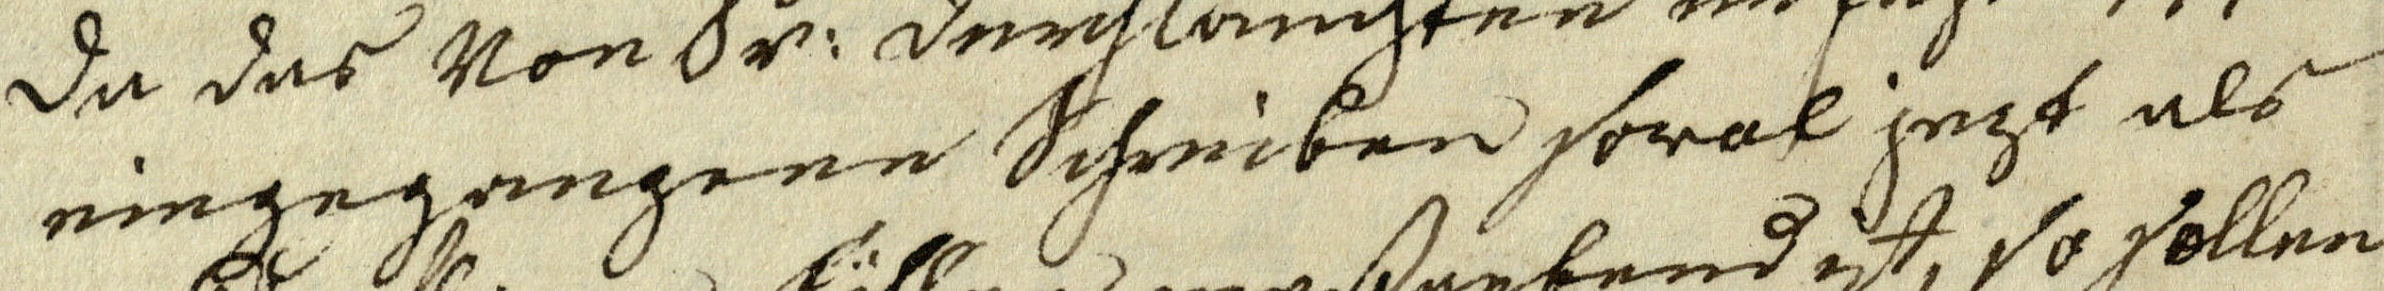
eingegangene Schreiben sowol jezt als
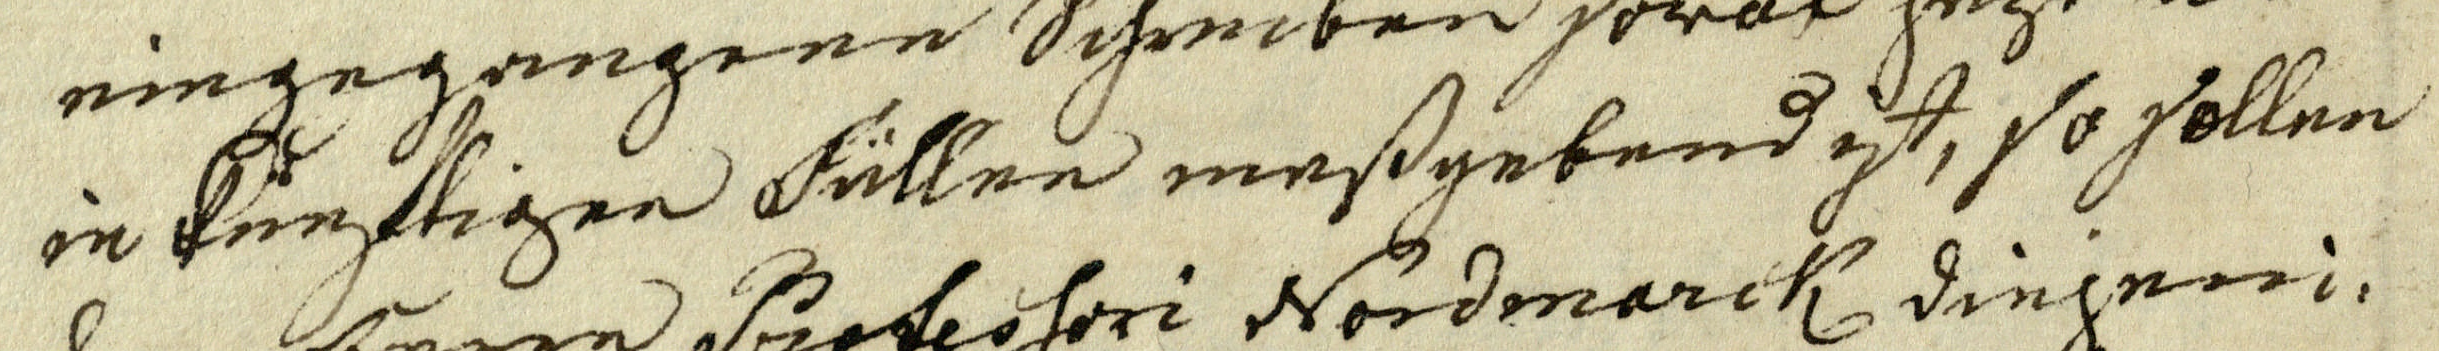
in künftigen Fällen maßgebend ist, so sollen
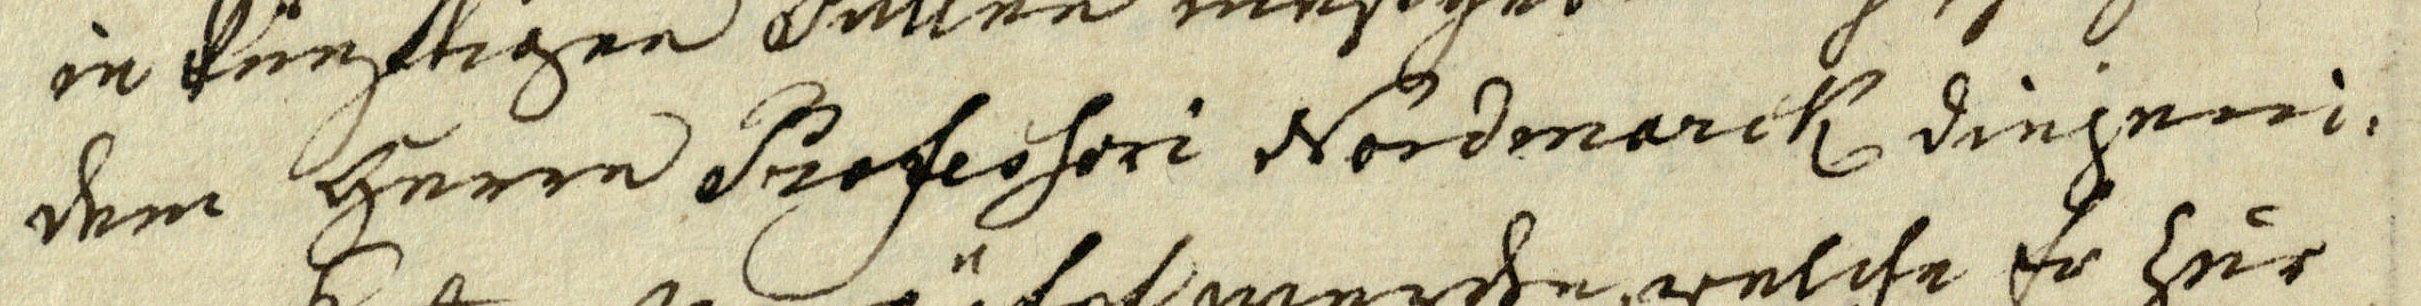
dem Herrn Professori Nordmarck diejeni¬
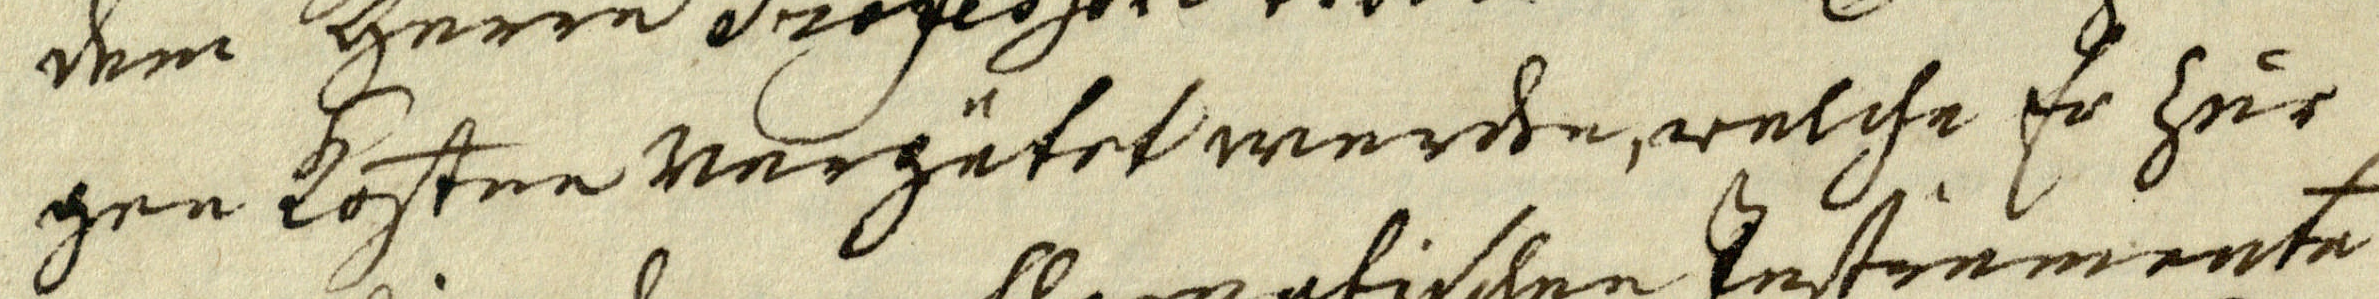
gen Kosten vergütet werden, welche Er zur
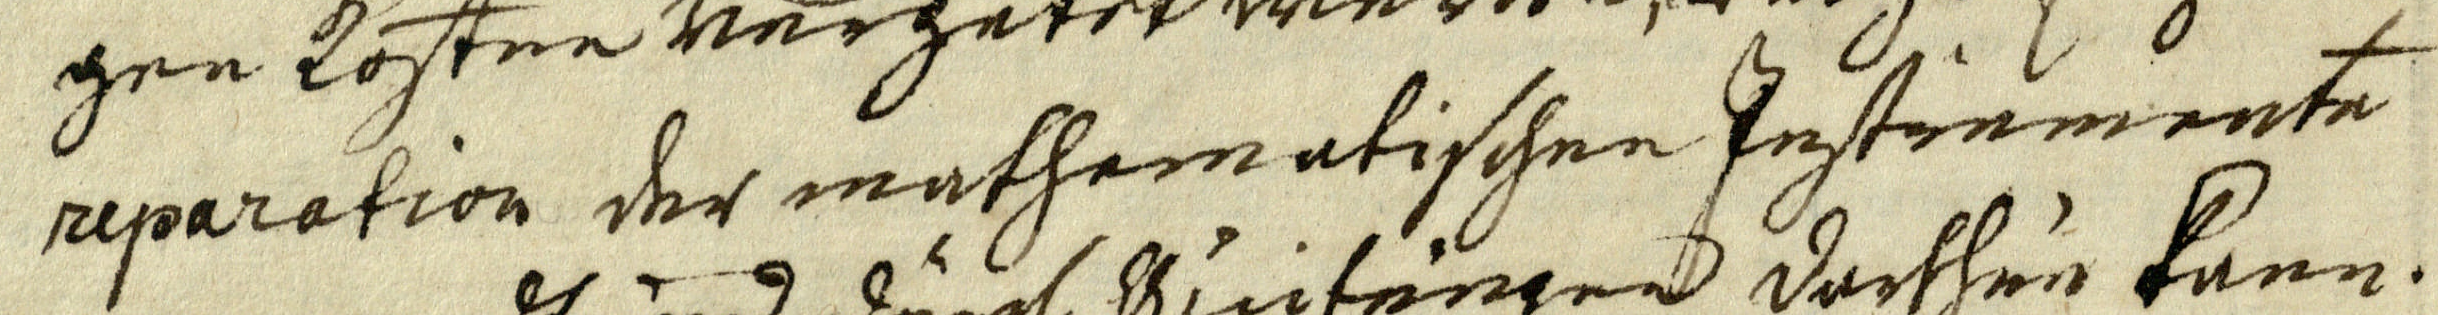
reparation der mathematischen Instrumente
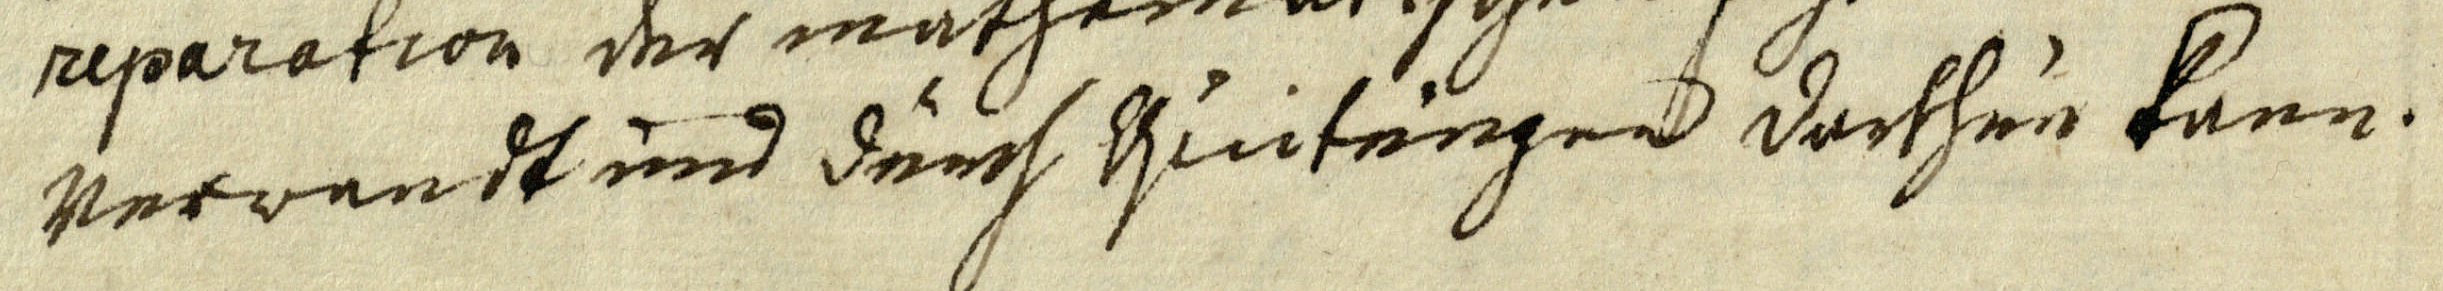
verwandt und durch Quitungen darthun kann.
